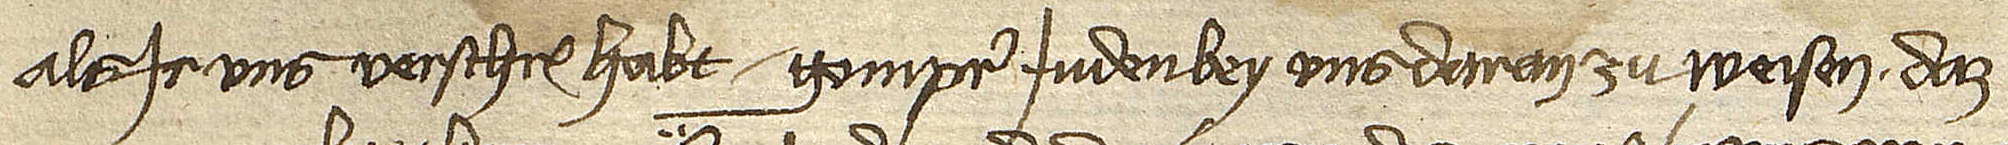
als Ir vns verſchr* / gompr* Iuden bey vns daran ʒu weiſen . daʒ
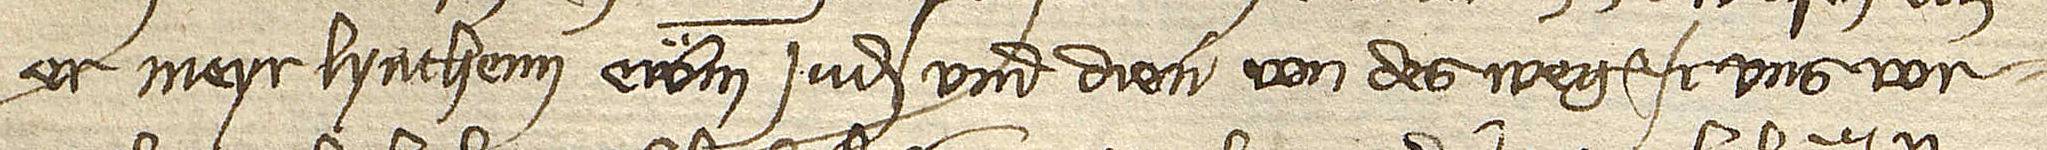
er meyr lyntheim ew*m Iud* vnd dien* von des weg* Ir vns vor =
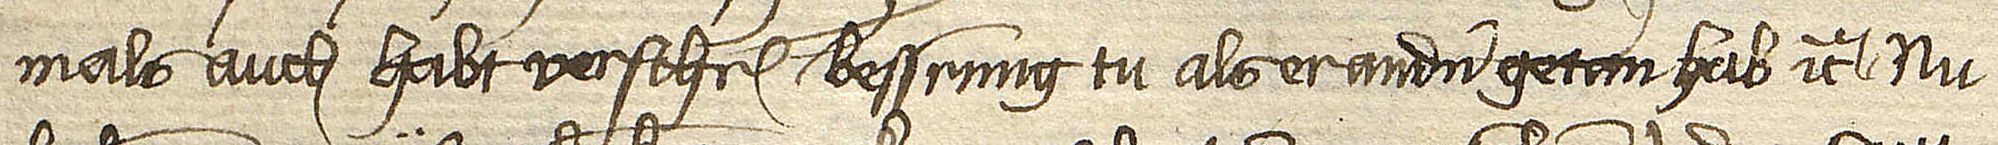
mals auch habt verſchr* beſſrung tu als er andn* getan hab ec* Nu
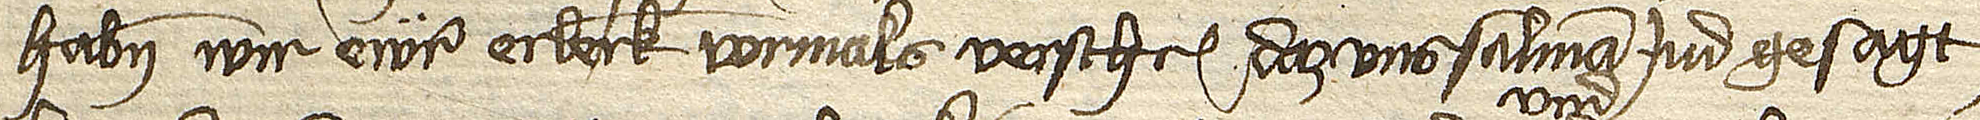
habn* wir ewr* erberk* vormals verſchr* daʒ vns ſalma* Iud geſagt
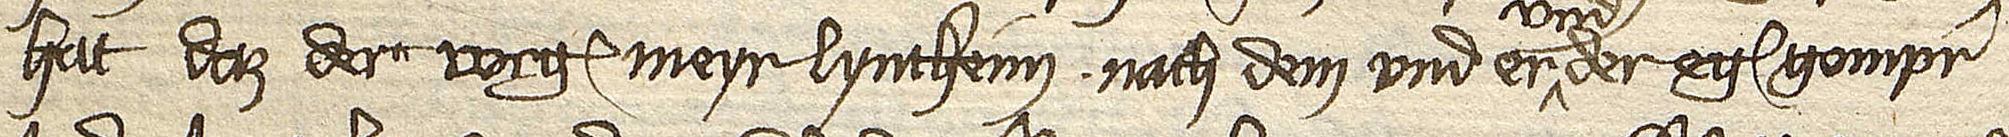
hat daʒ der vorg* meyr lyntheim . nach dem vnd er der eg* gompr*
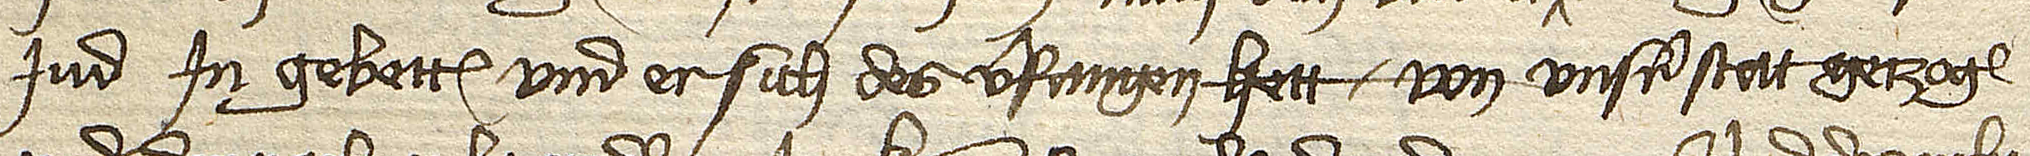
Iud In gebett* vnd er ſich des v*fangen hett / von vnſr* ſtat gecʒog*
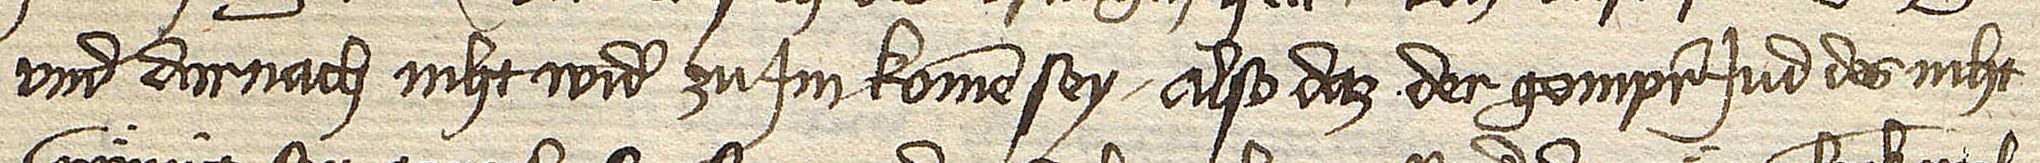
vnd darnach niht wid* ʒu Im kome* ſey / alſo daʒ der gompr* Iud des niht
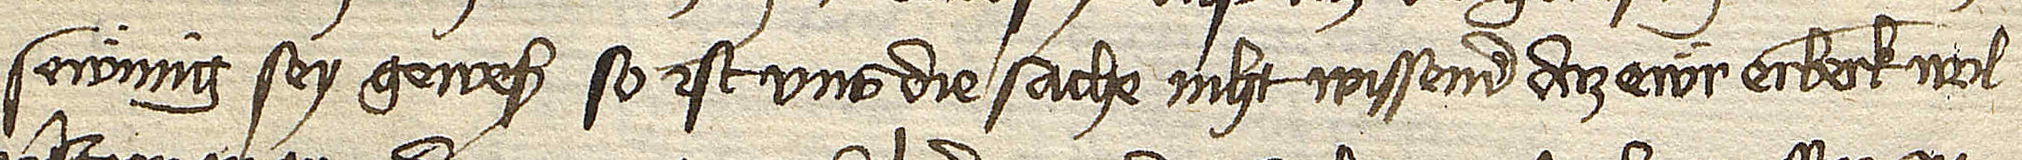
ſewmig ſey geweſ* ſo iſt vns die ſache niht wiſſend daʒ ewr erberk* wol
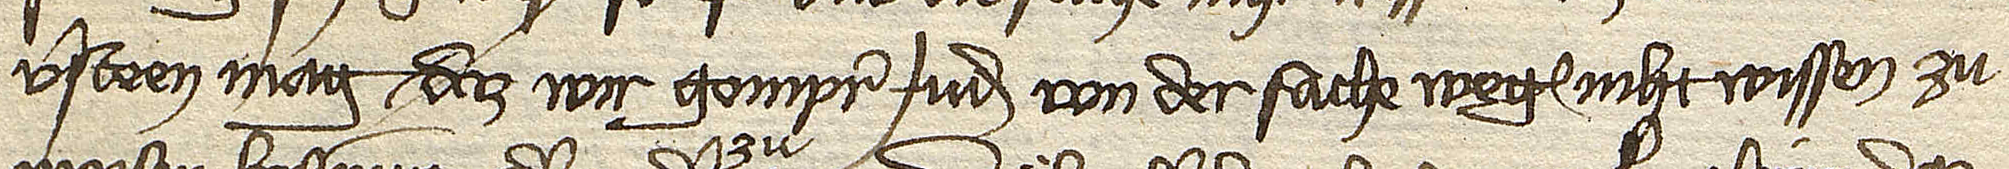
v*ſteen mag / daʒ wir gompr* Iud* von der ſache weg* niht wiſſen ʒu
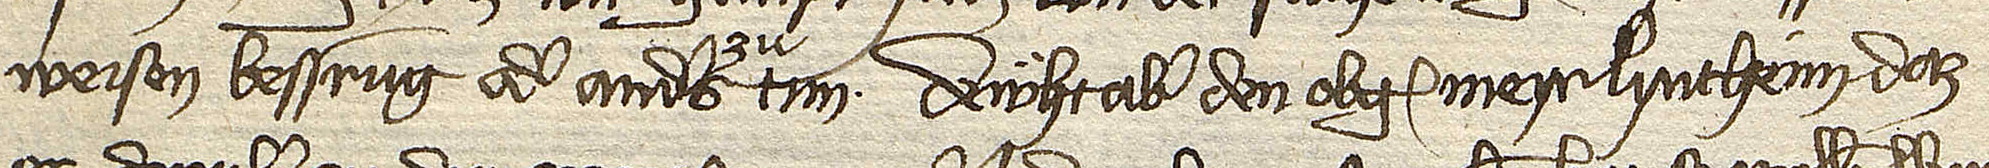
weiſen beſſrug* od* and*s tun . Dewht ab* den obg* meyr lyntheim daʒ
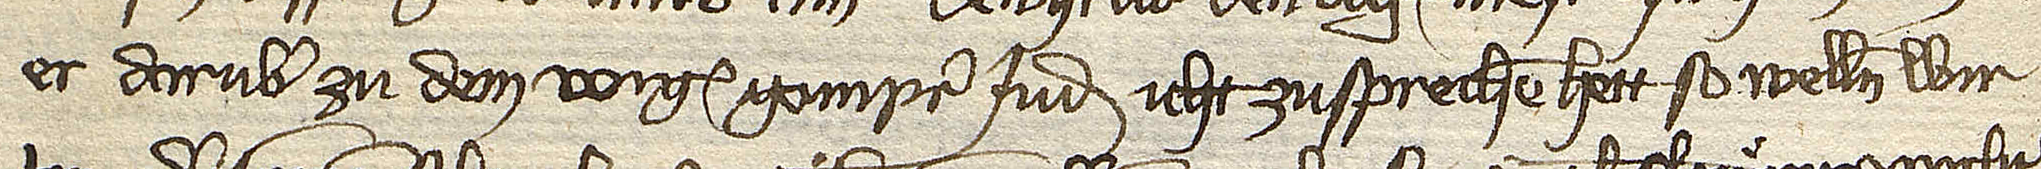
er darub* ʒu dem vorg* gompr* Iud* icht ʒuſpreche* hett ſo welln* wir
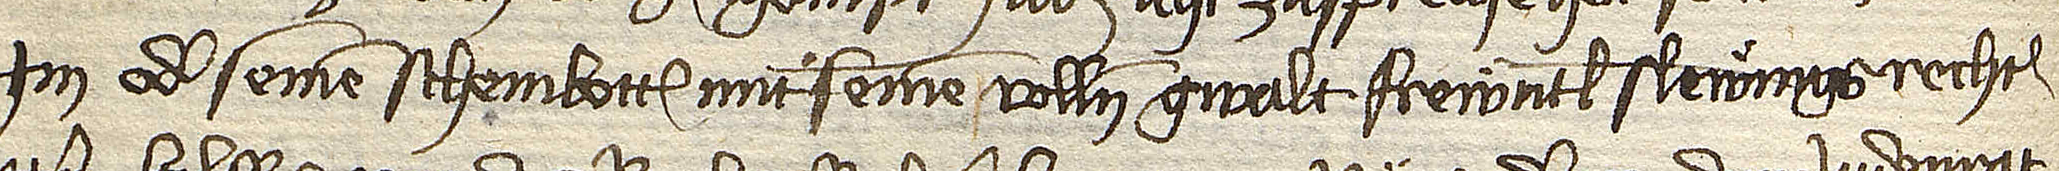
Im od* ſeine* ſcheinbott* mit ſeine* volln* gwalt frewntl* ſlewnigs recht*
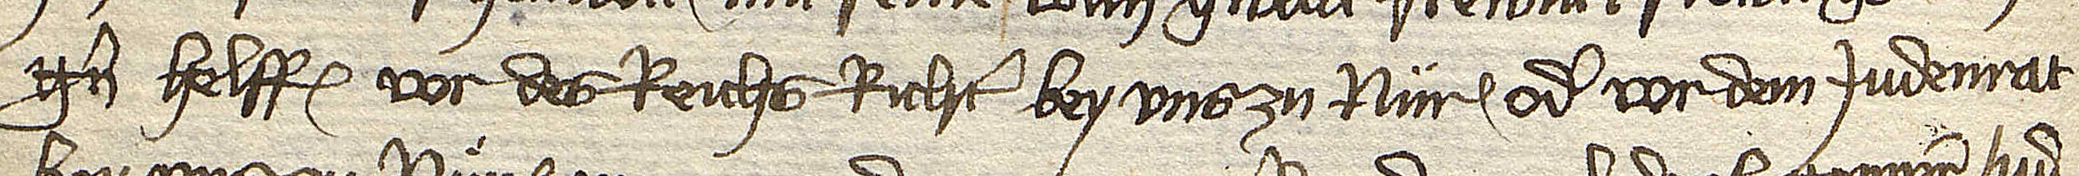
g*n helff* vor des Reichs Richt* bey vns ʒu Nür* od* vor dem Iudenrat
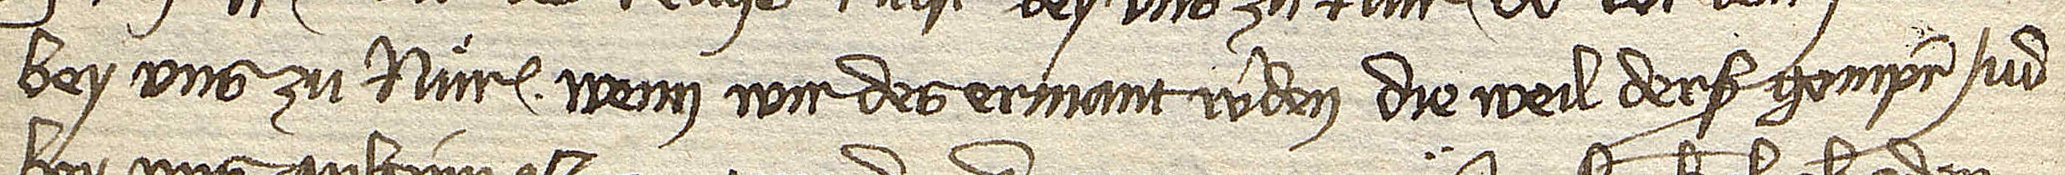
bey vns ʒu Nür* . wenn wir des ermant w*den die weil derſ* gompr* Iud
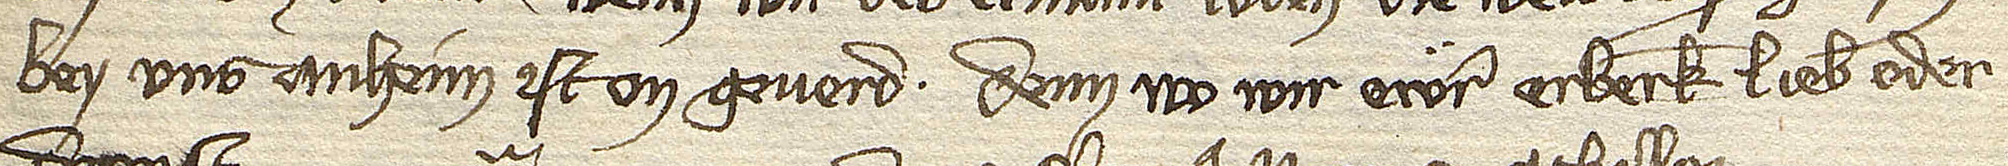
bey vns anheim iſt on geuerd . Denn wo wir ewr* erberk* lieb oder
